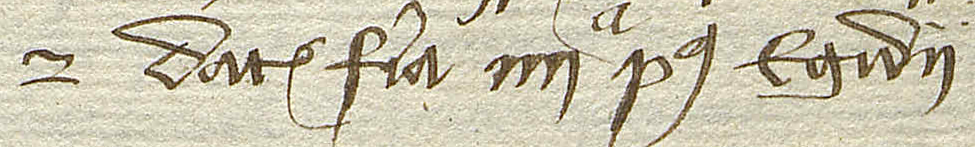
2 Dat* fia* iiii* p* Egidii
